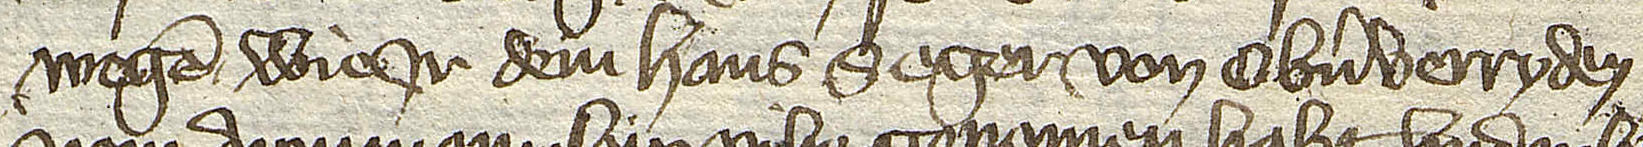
wege* / wie Ir dem hans Seger von Obn* verryden
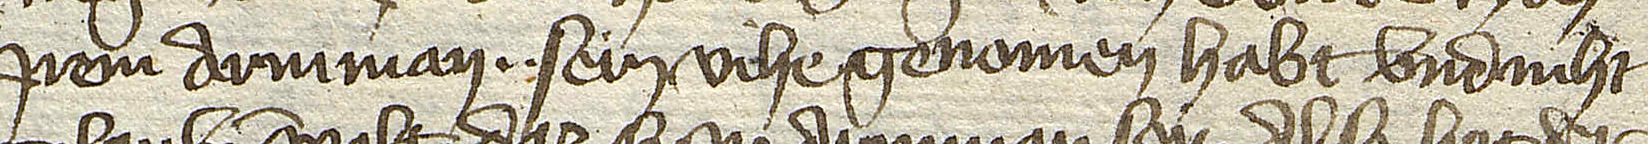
Irem Armman ~ ſein vihe genomen habt vnd niht
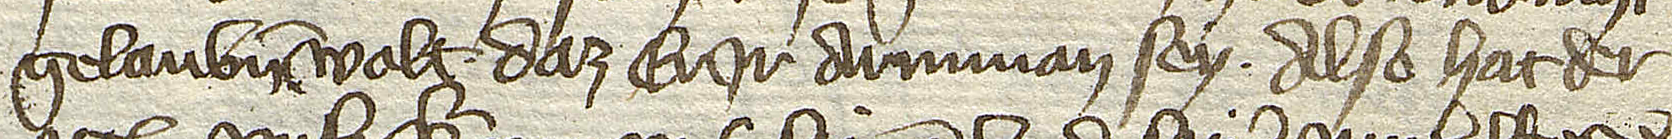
gelaubn* wolt . daʒ Er Ir Armman ſey . Alſo hat der
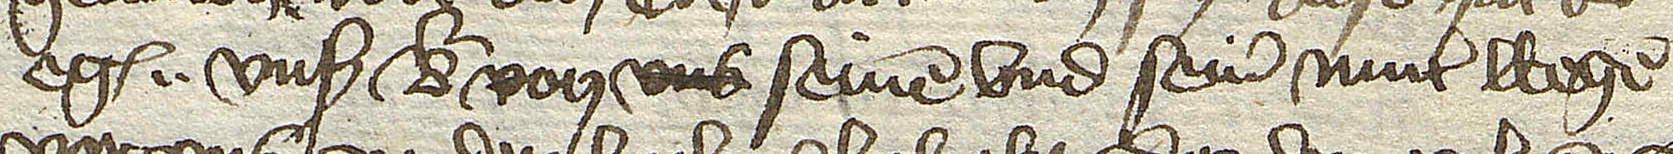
eg* ~ vnſ* B* von vns ſeine* vnd ſein* mut* wege*
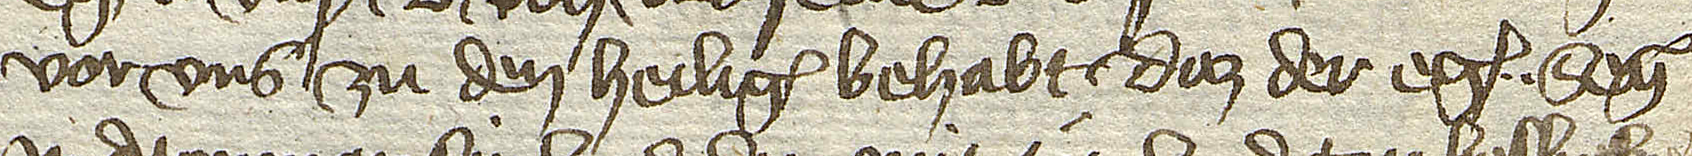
vor vns ʒu den heilig* behabt / daʒ der eg* ~ Seg*
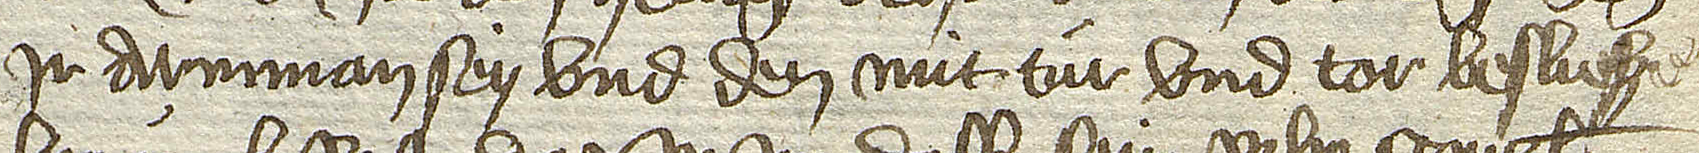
Ir Armman ſey vnd den mit tür vnd tor beſlieſʒe*
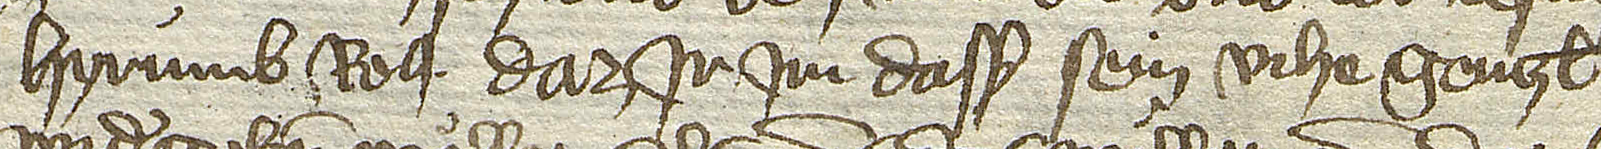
hyrümb Ro* . daʒ Ir Im daſſ* ſein vihe gencʒl*
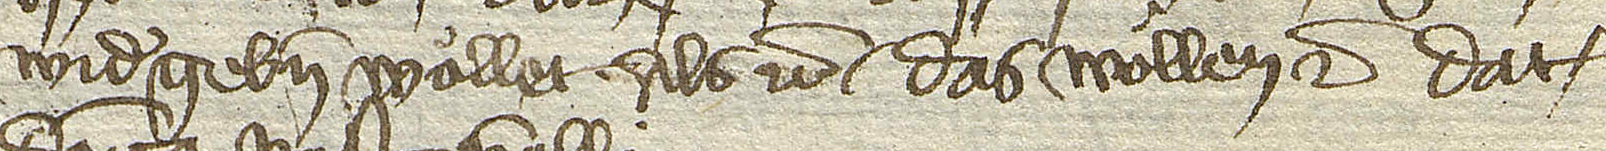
wid*gebn* wöllet . Als ec* / Das wöllen ec* Dat*
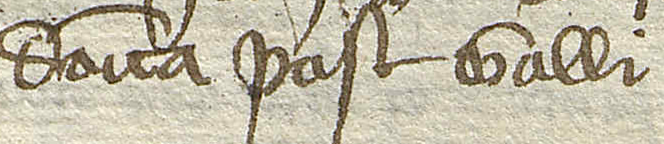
Doi*ca poſt Galli
